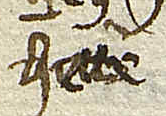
hette
